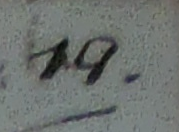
19.
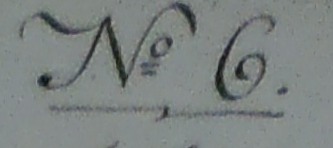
No͇ 6.
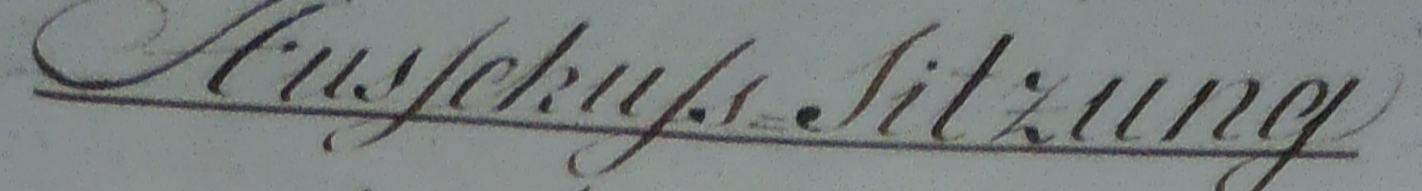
Ausschuss‗Sitzung
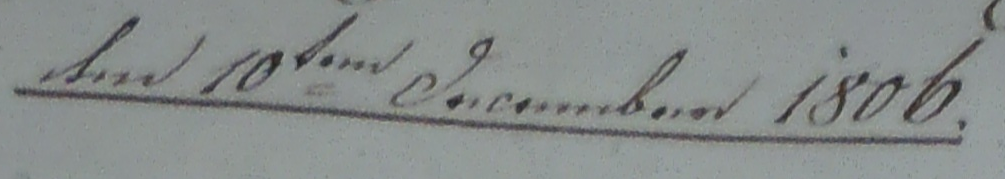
den 10te͇n Dezember 1806.
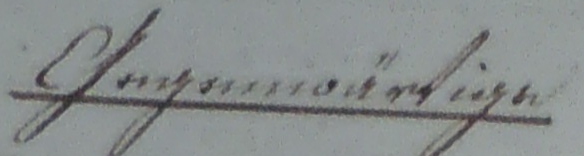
Gegenwärtige
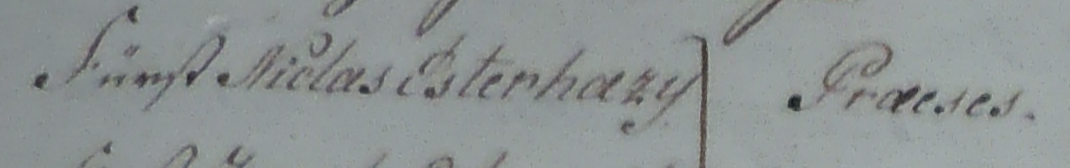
Fürst Niclas Esterhazy Praeses.
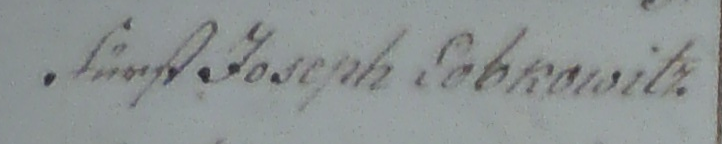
Fürst Joseph Lobkowitz
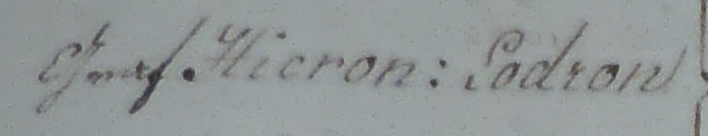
Graf Hieron: Lodron
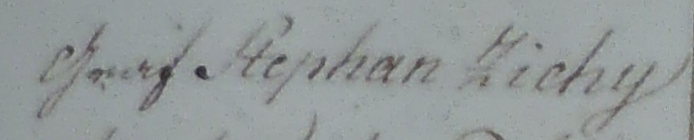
Graf Stephan Zichy
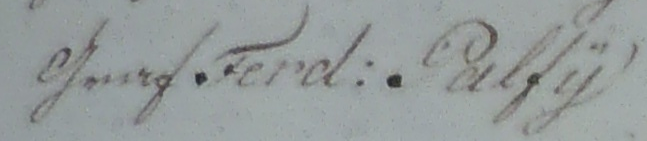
Graf Ferd: Palfy
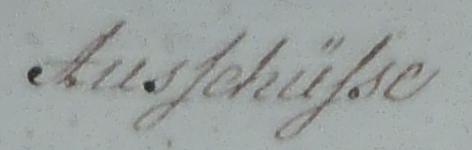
Ausschüsse
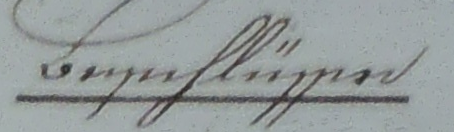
Beschlüsse
